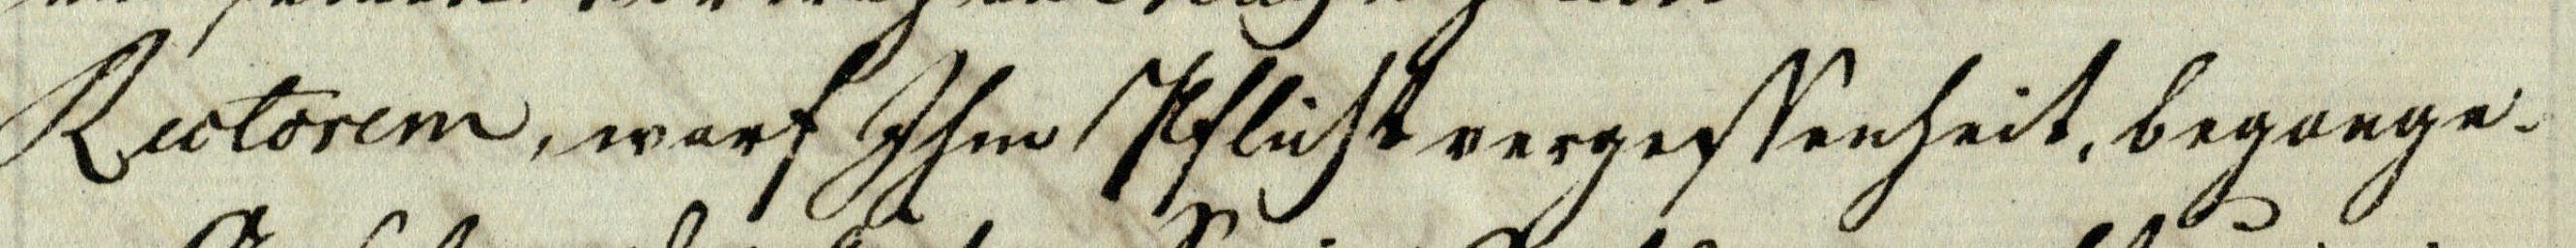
Rectorem, warf Ihm Pflichtvergessenheit, begange¬
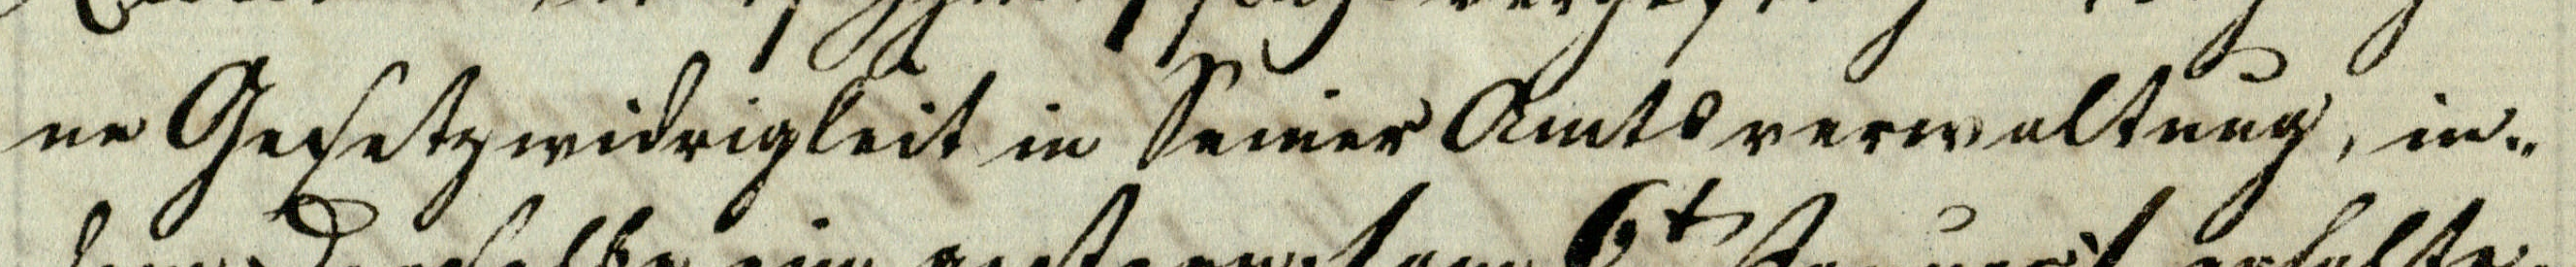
ne Gesetzwidrigkeit in Seiner Amtsverwaltung, in¬
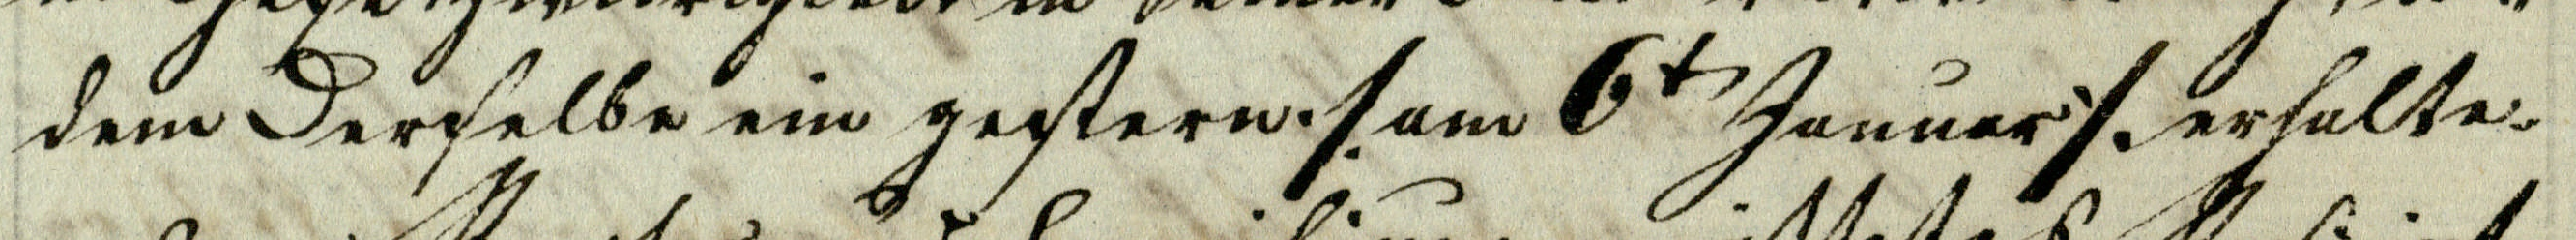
dem derselbe ein gestern /. am 6 ten Januar/. erhalte¬
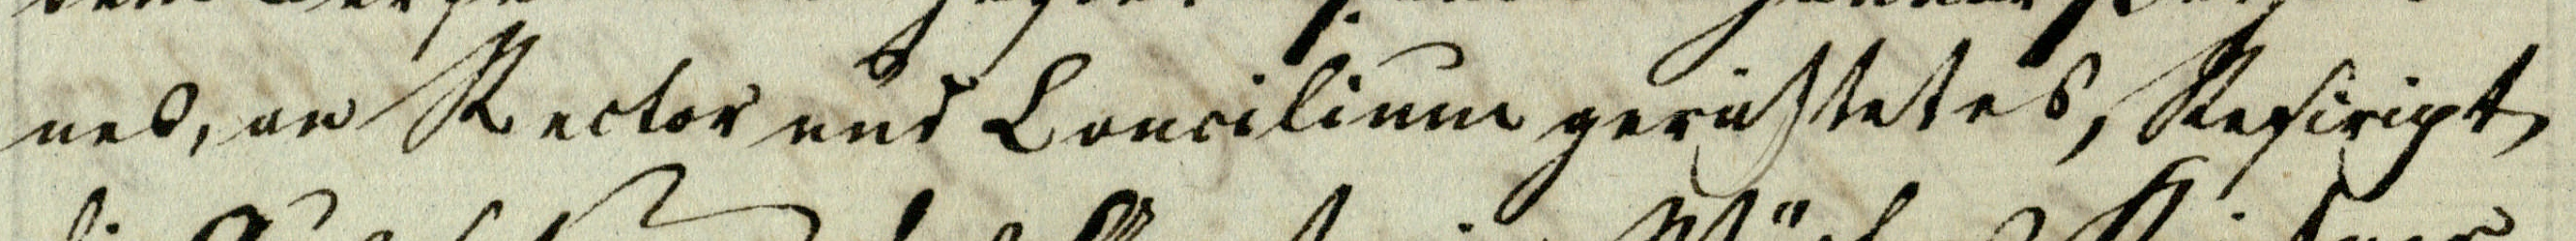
nes, an Rector und Concilium gerichtetes, Rescript
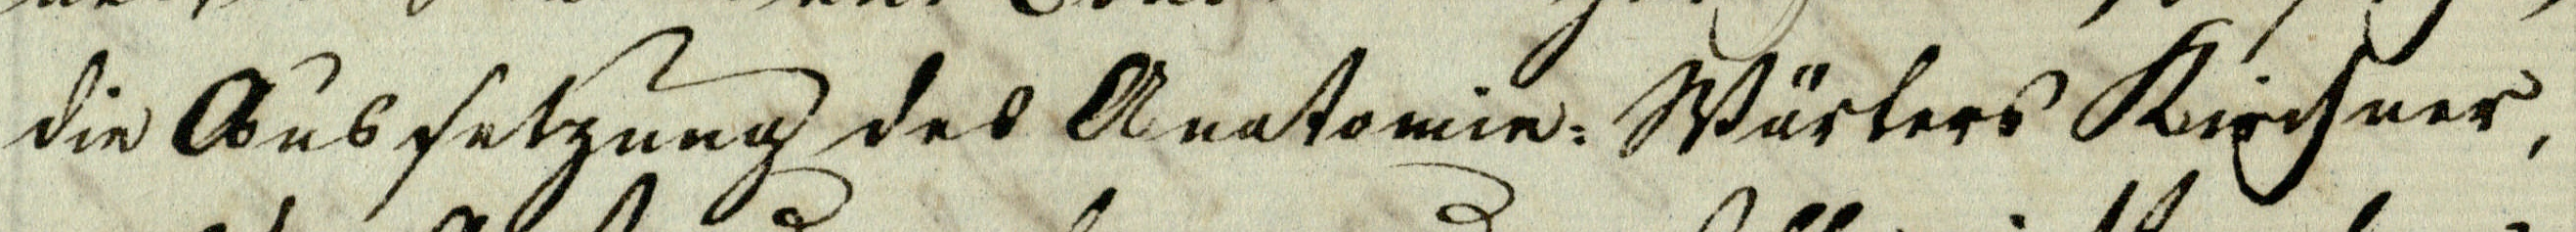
die Aussetzung des Anatomie- Wärters Kirchner,
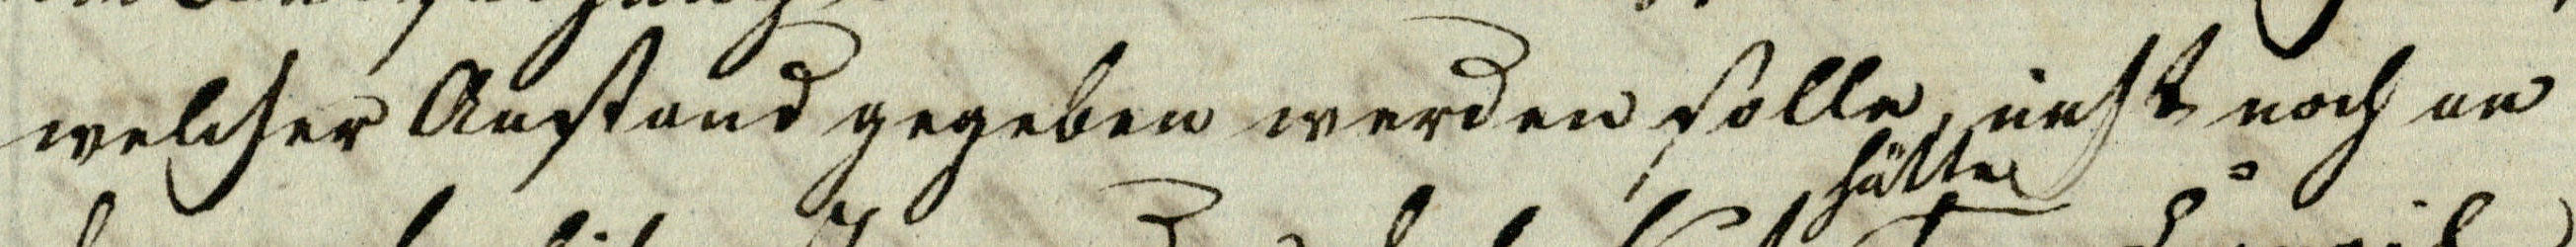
welcher Anstand gegeben werden solle, nicht noch an
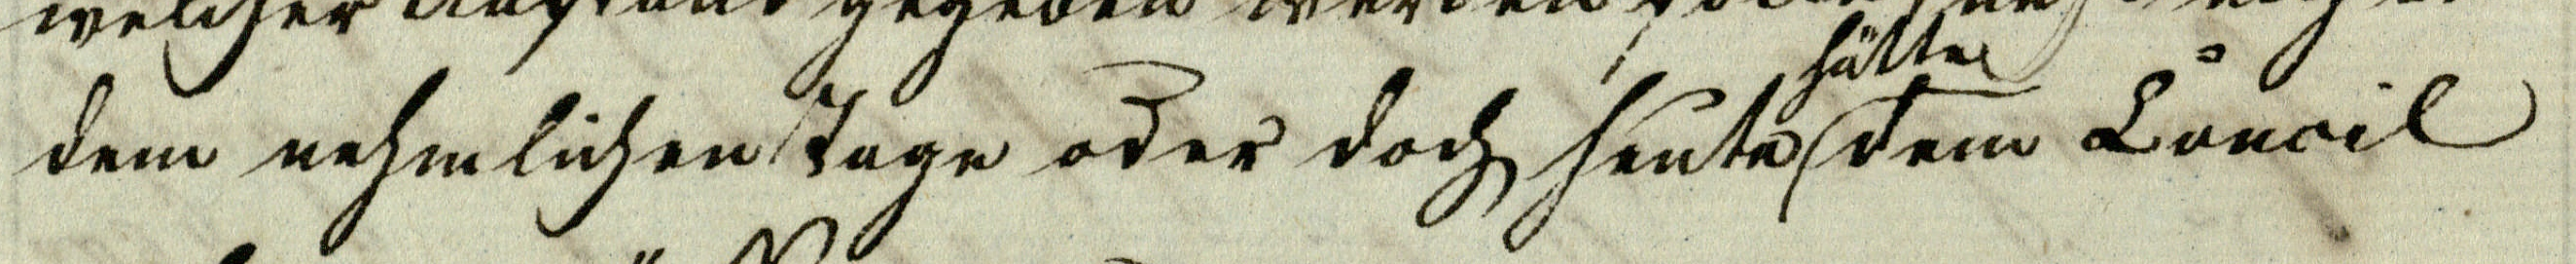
dem nehmlichen Tage oder doch heute hätte dem Concil
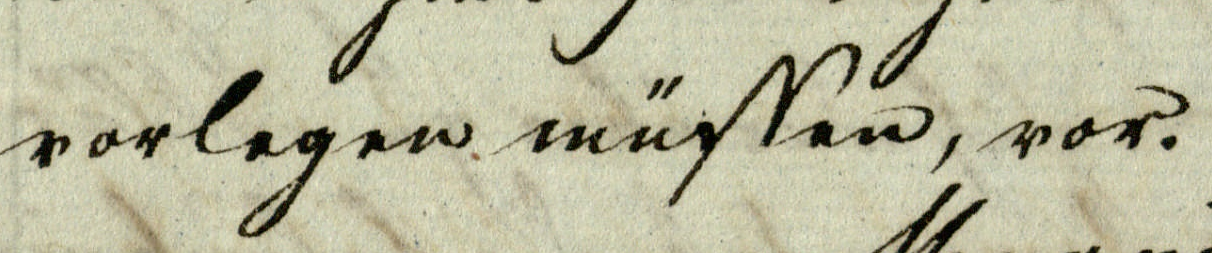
vorlegen müssen, vor.
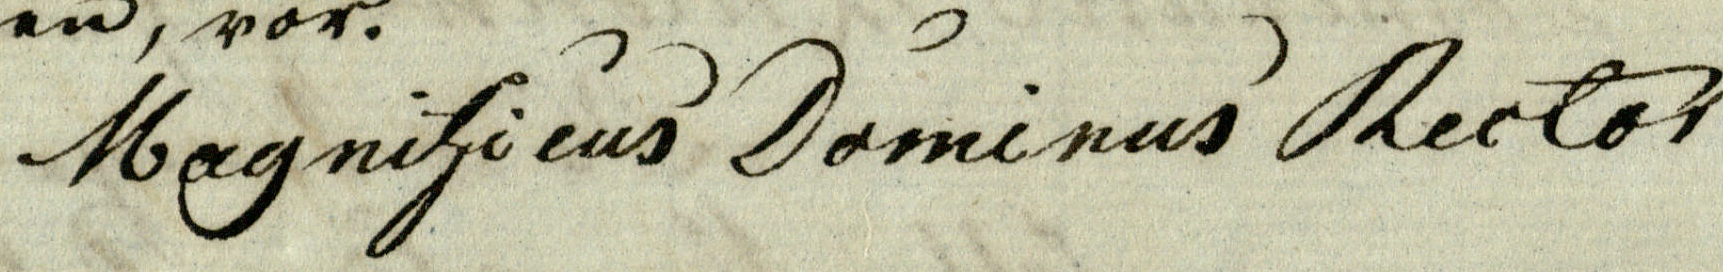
Magnificus Dominus Rector
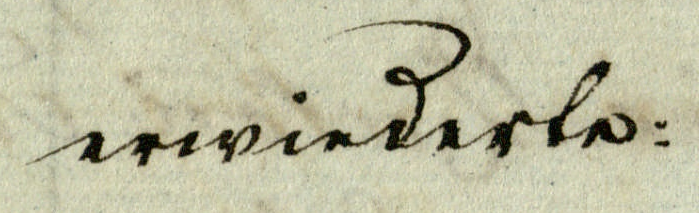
erwiederte:
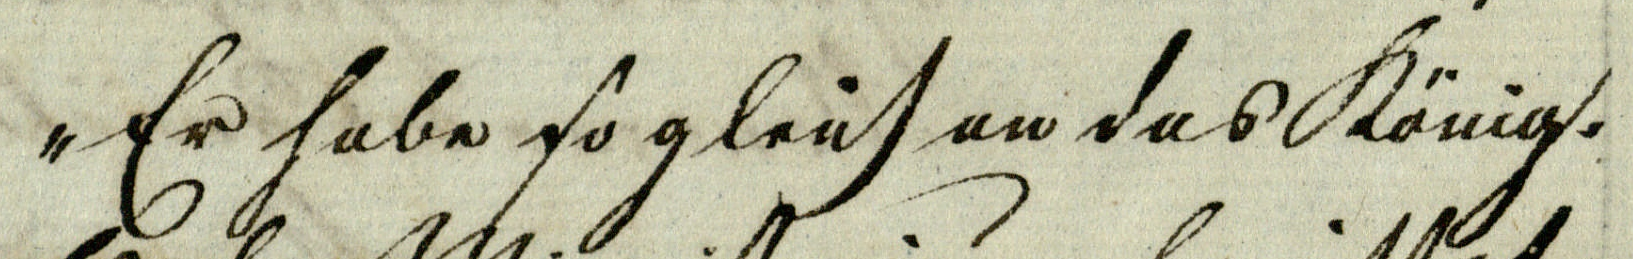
"Er habe so gleich an das König¬
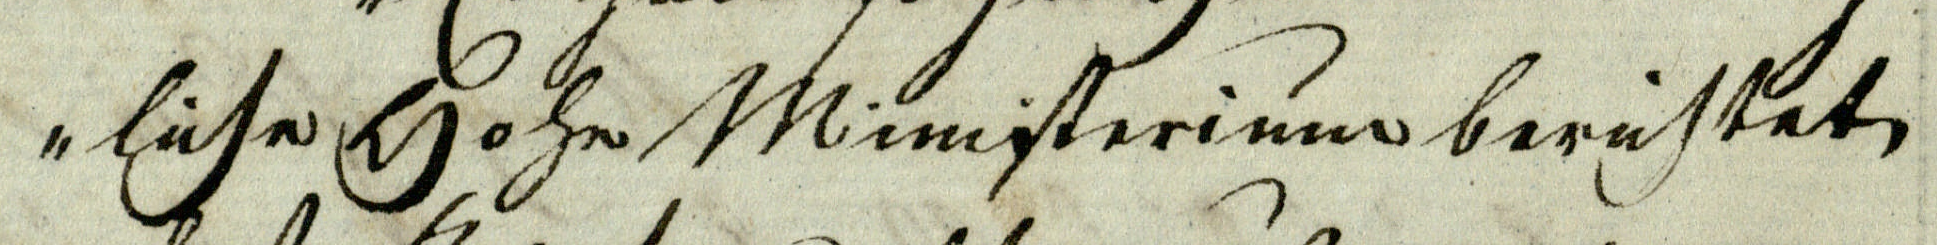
"liche Hohe Ministerium berichtet,
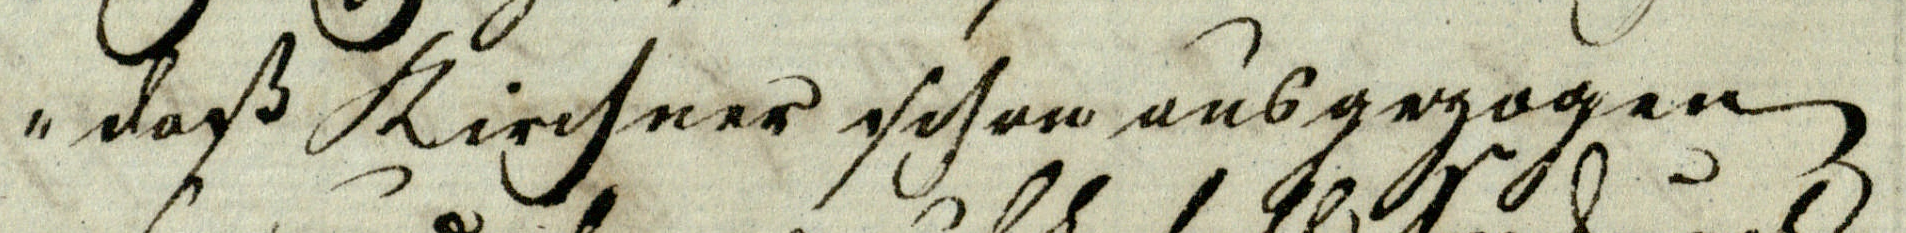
"daß Kirchner schon ausgezogen
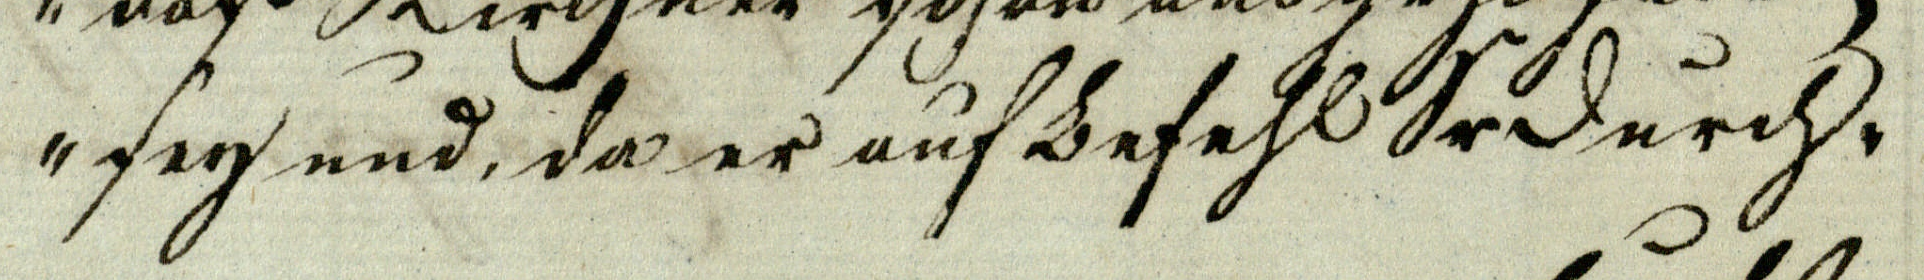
sey und, da er auf Befehl Sr Durch¬
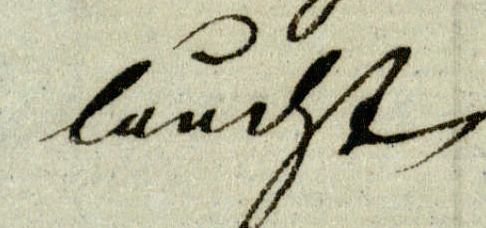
laucht
